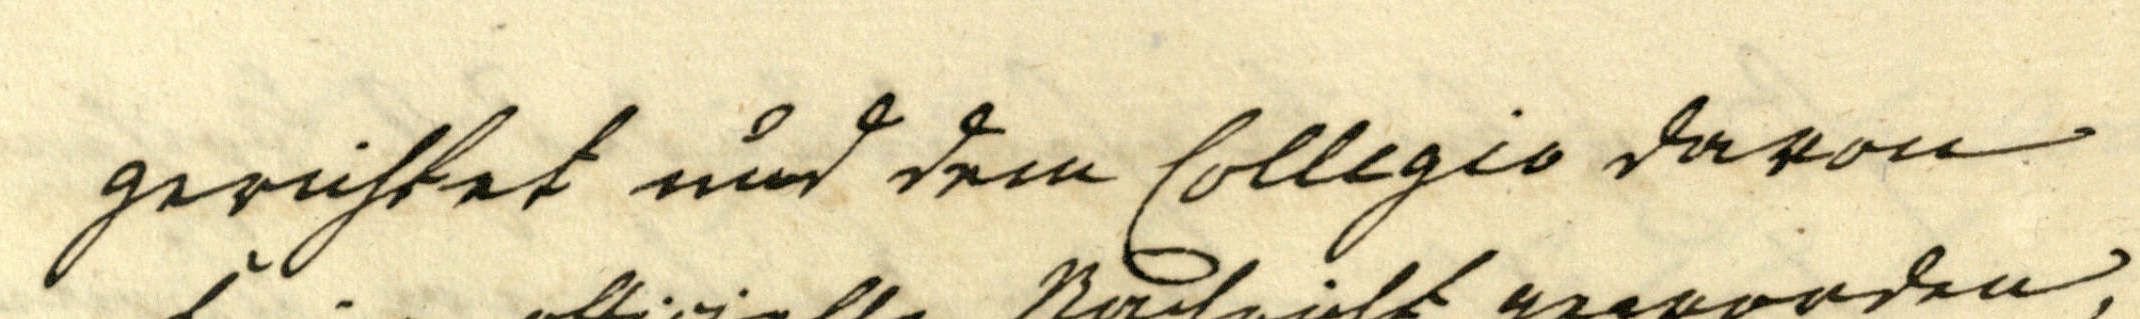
gerichtet und dem Collegio davon
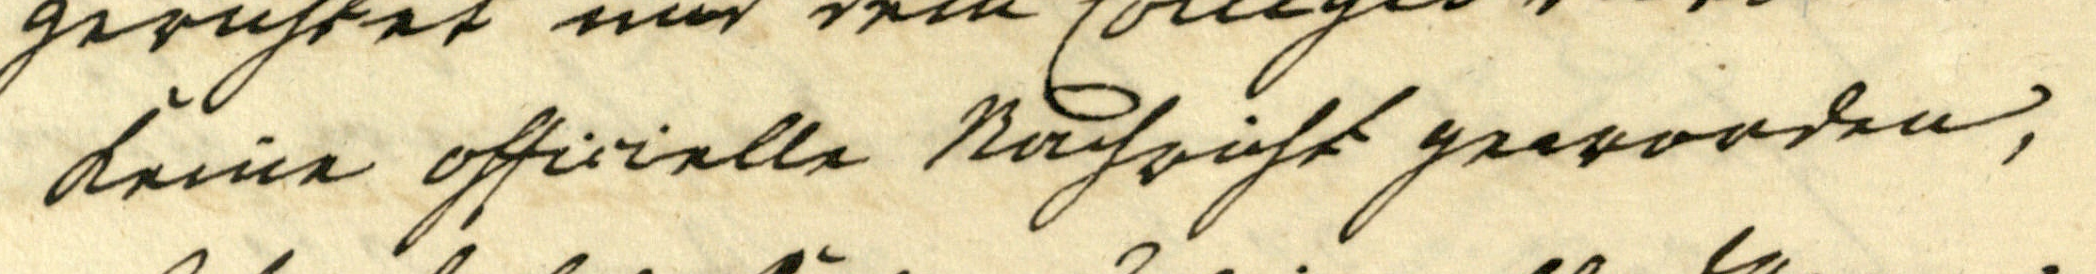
keine officielle Nachricht geworden,
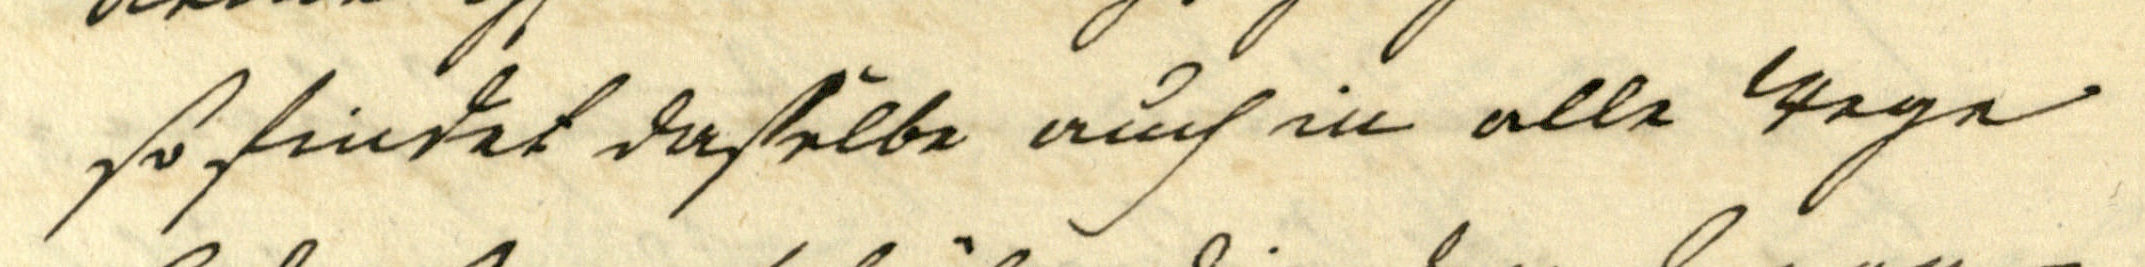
so findet dasselbe auch in alle Wege
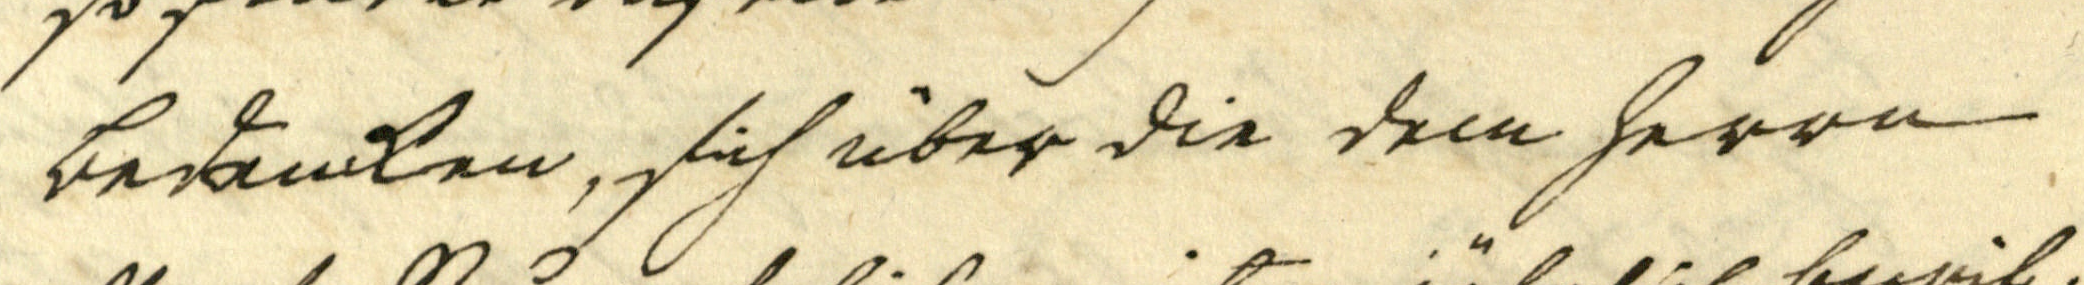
Bedencken, sich über die dem Herrn
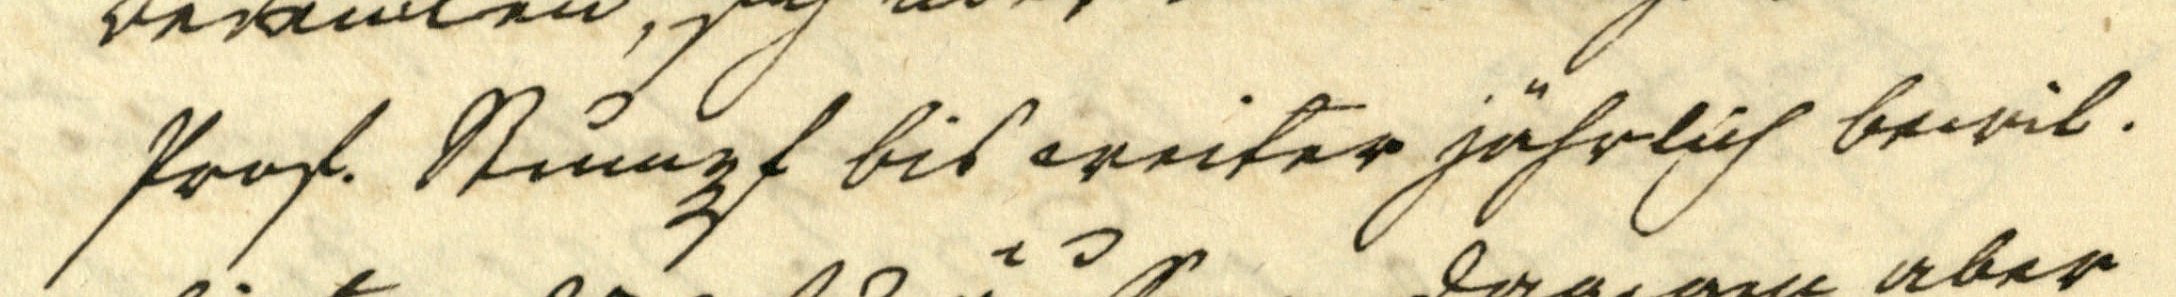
Prof. Stumpf bis weiter jährlich bewil¬
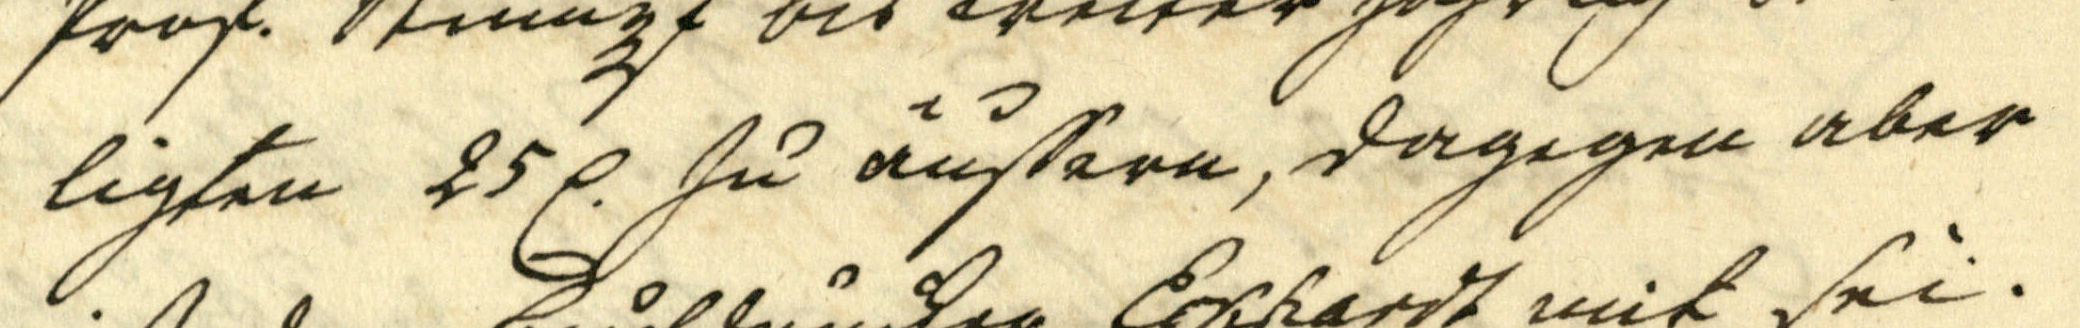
ligten 25 l. zu äussern, dagegen aber
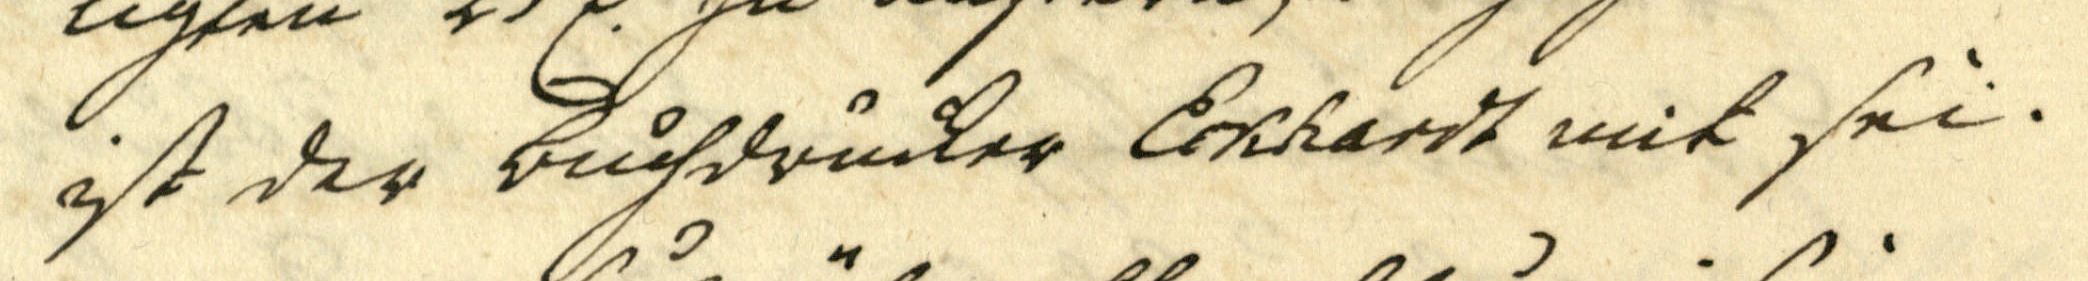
ist der Buchdrucker Eckhardt mit sei¬
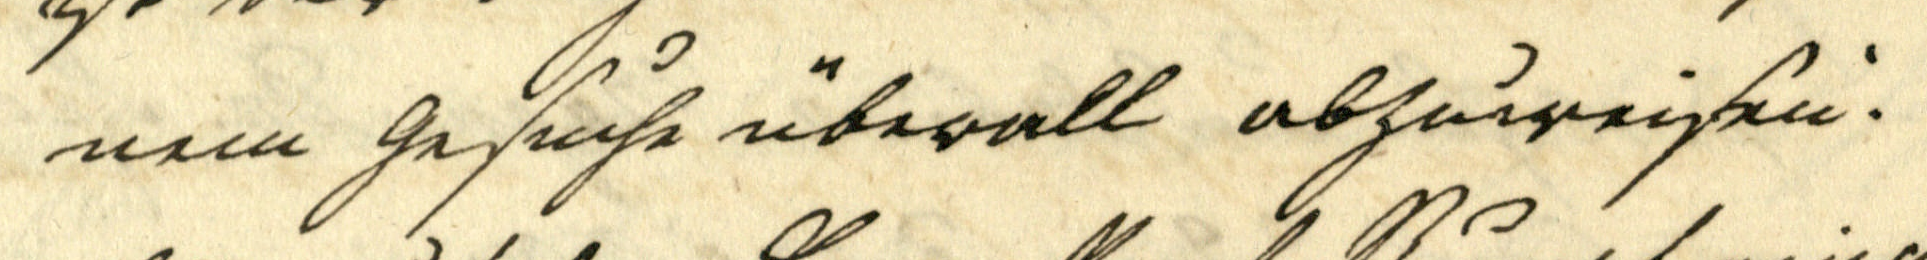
nem Gesuche überall abzuweisen.
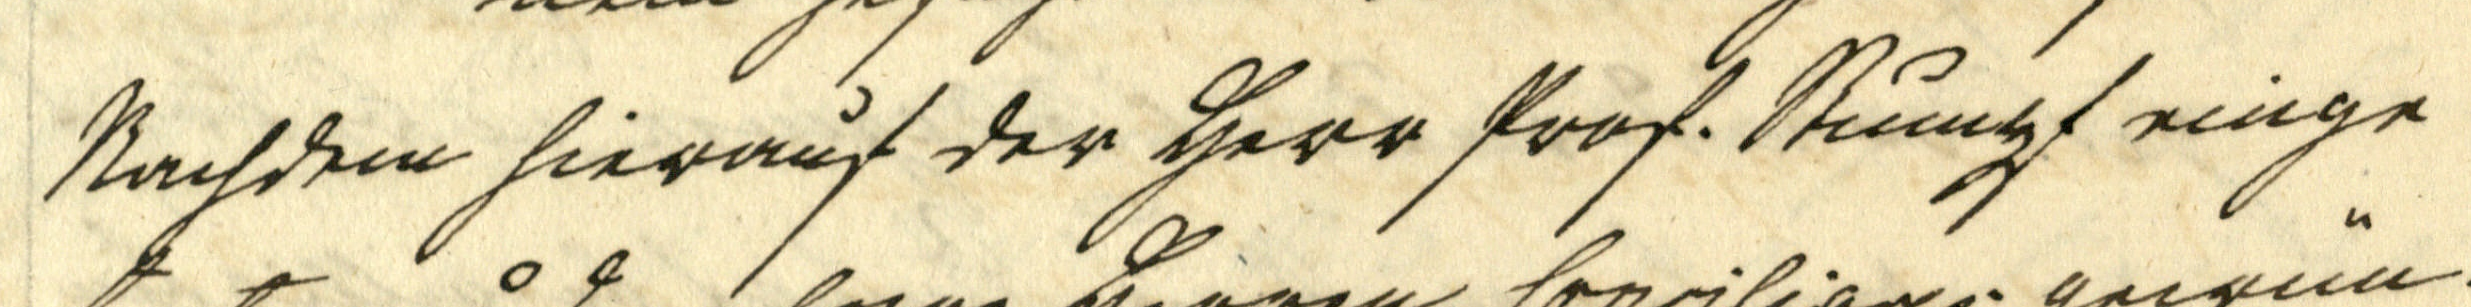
Nachdem hierauf der Herr Prof. Stumpf einge¬
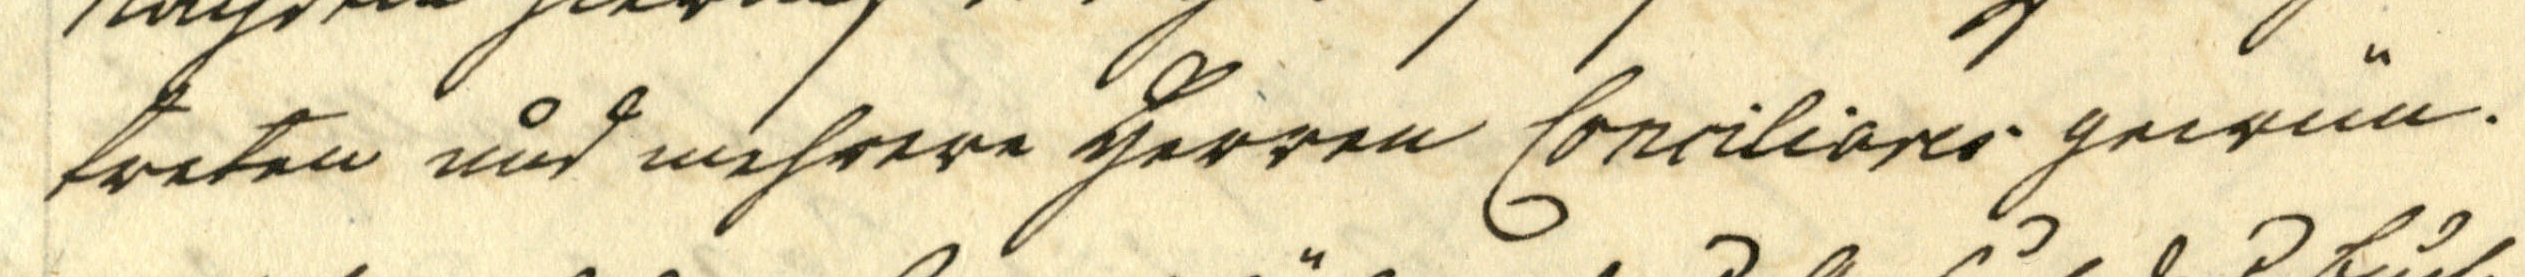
treten und mehrere Herren Conciliares gewün¬
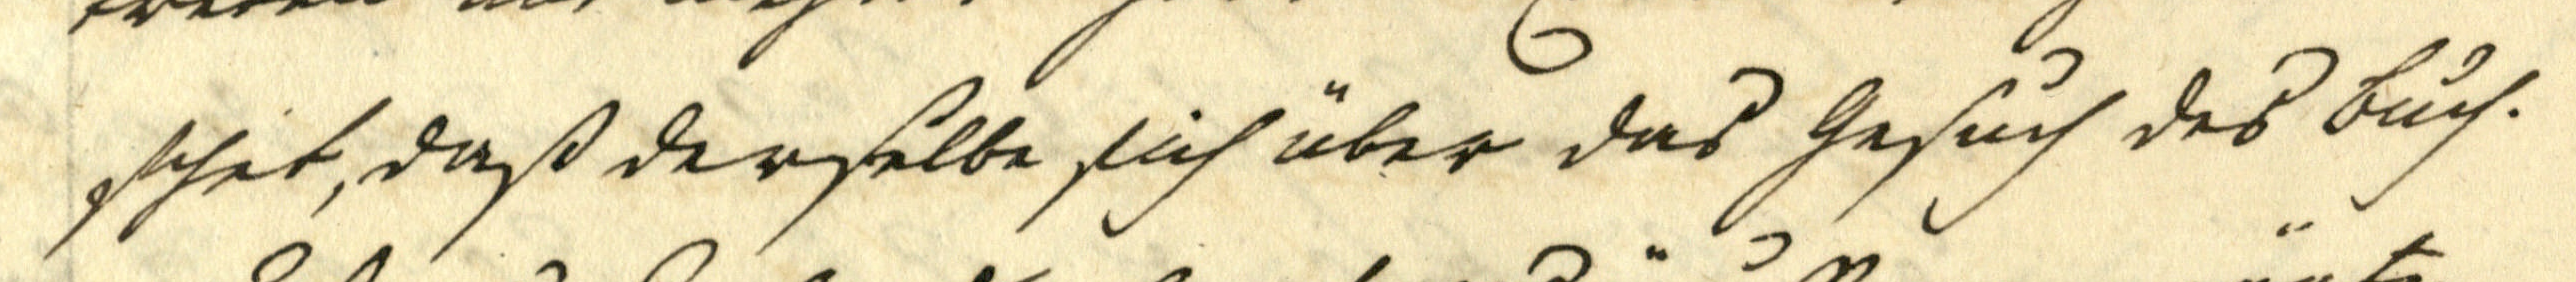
schet, daß derselbe sich über das Gesuch des Buch¬
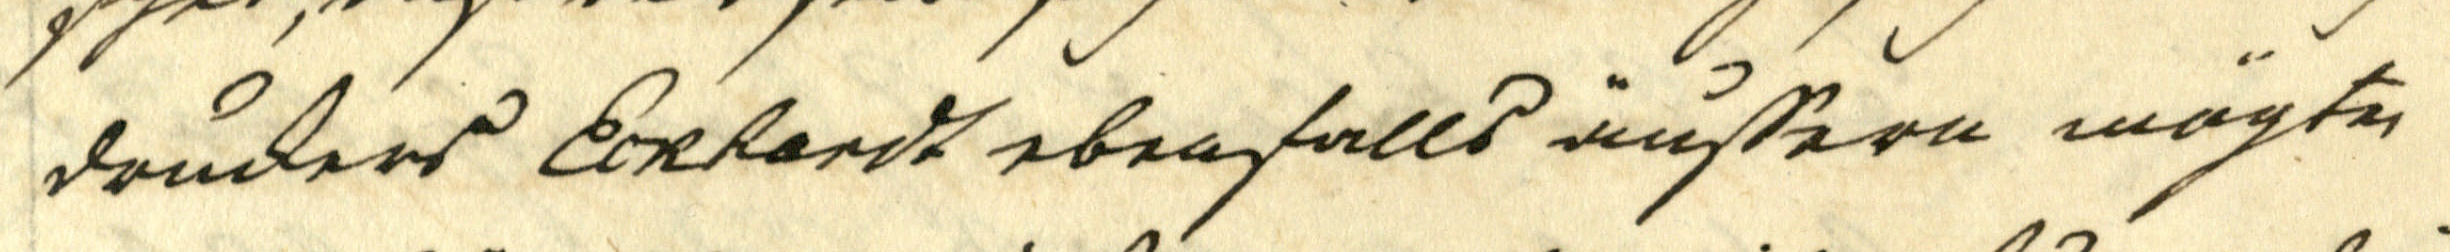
druckers Eckhardt ebenfalls äussern mögte,
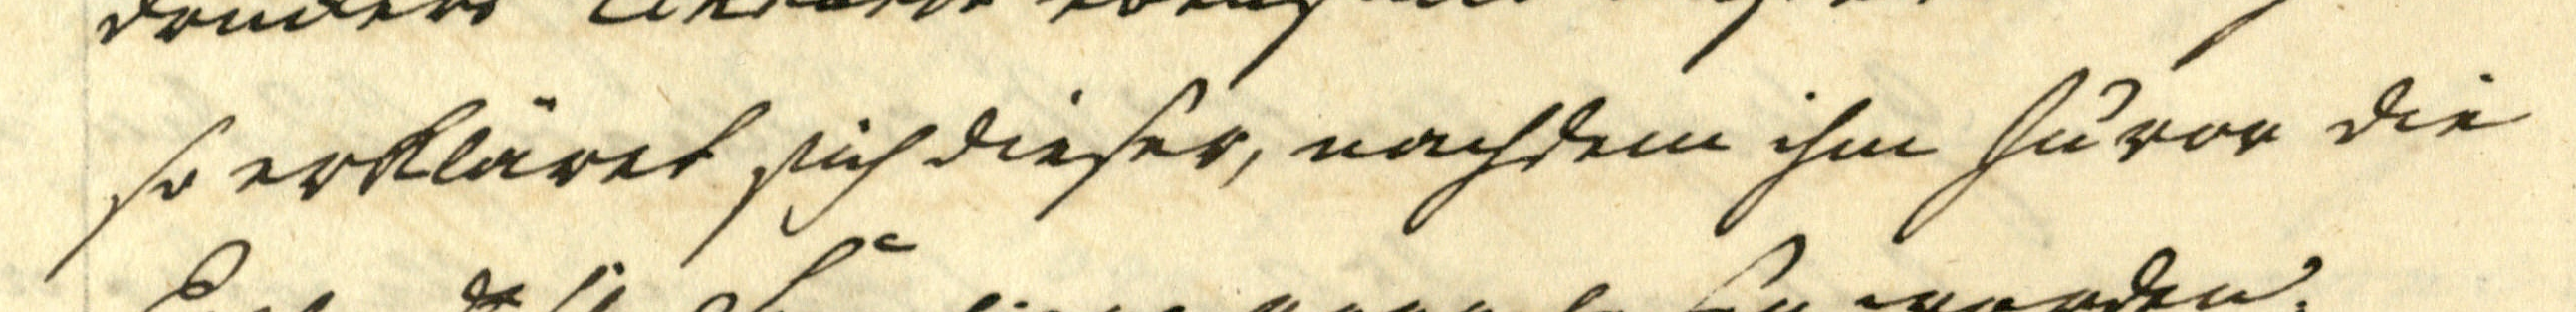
so erkläret sich dieser, nachdem ihm zuvor die
